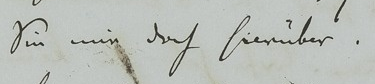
Sie mir doch hierüber.
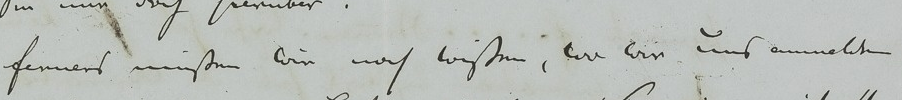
Ferners müßen wir noch wißen, wo wir uns anmelden
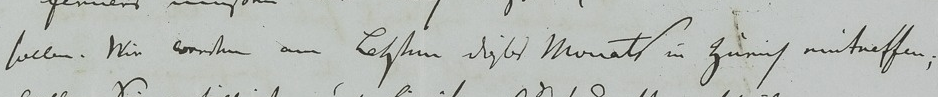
sollen. Wir werden am Letzten dieses Monats in Zürich eintreffen;
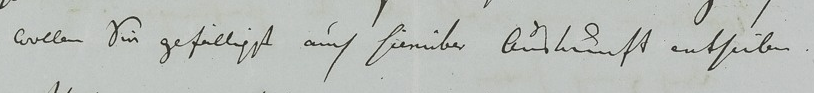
wollen Sie gefälligst auch hierüber Auskunft ertheilen.
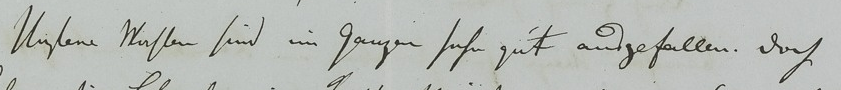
Unsere Wahlen sind im Ganzen sehr gut ausgefallen. Doch
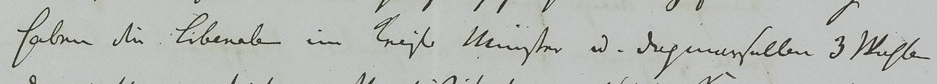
haben die Liberalen im Kreise Münster u. Dagmarsellen 3 Wahlen
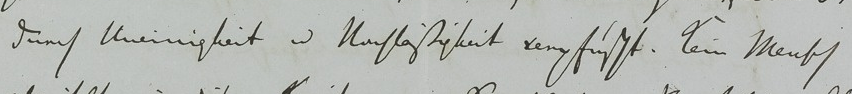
durch Uneinigkeit u Nachläßigkeit verpfuscht. Kein Mensch
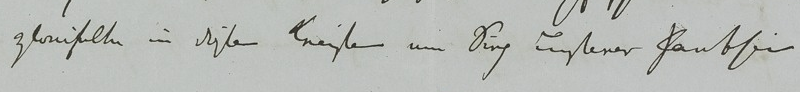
zweifelte in diesen Kreisen am Sieg unserer Parthei.
